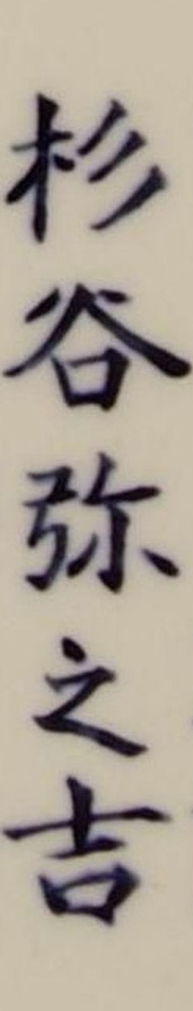杉谷弥之吉
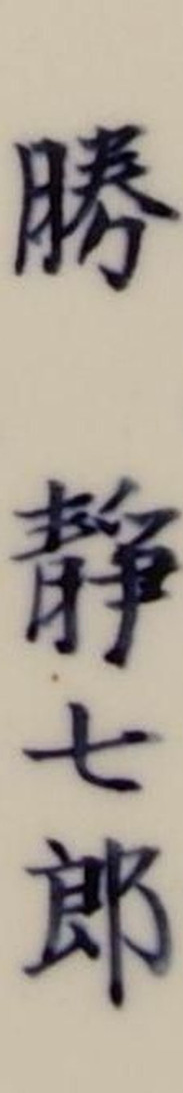勝静七郎
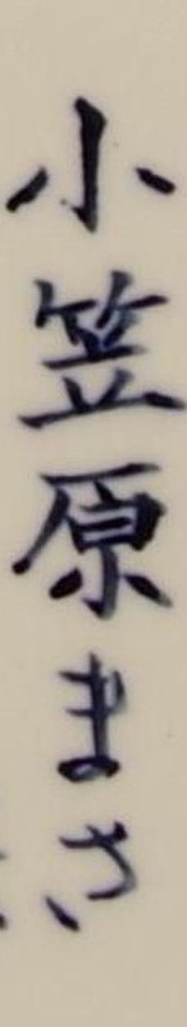小笠原まさ
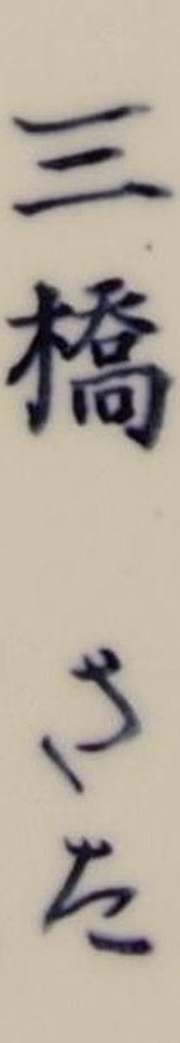三橋さた
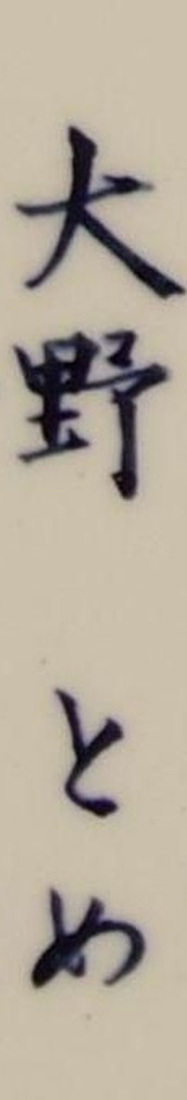大野とめ
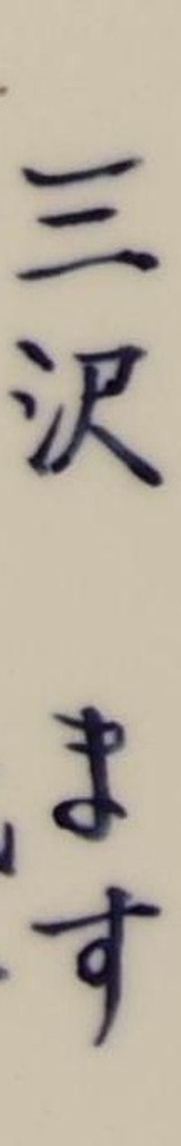三沢ます
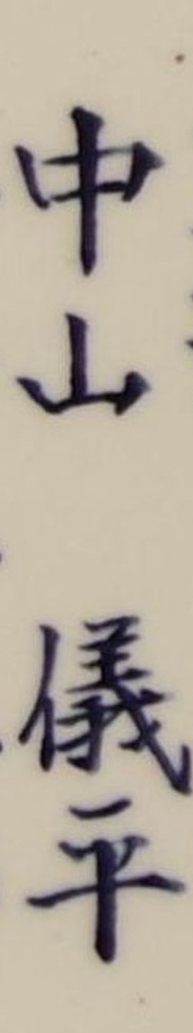中山儀平
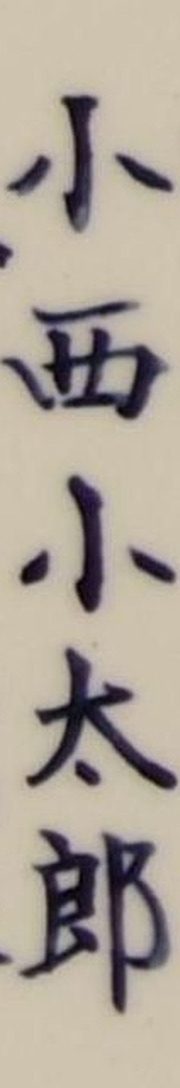小西小太郎
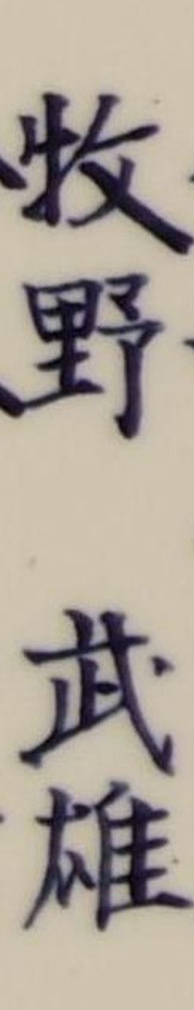牧野武雄
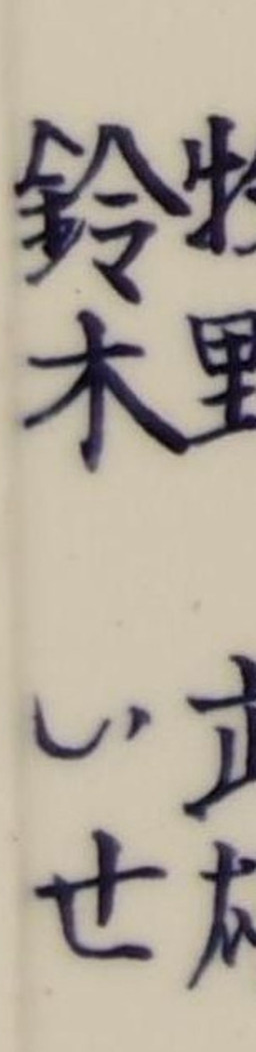鈴木いせ

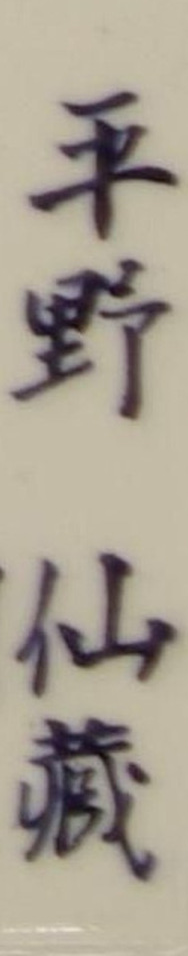平野仙蔵
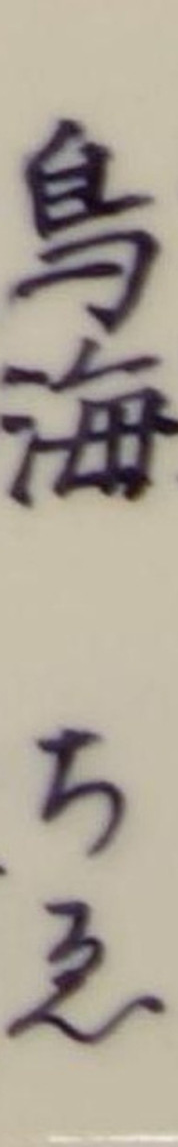鳥海ちゑ
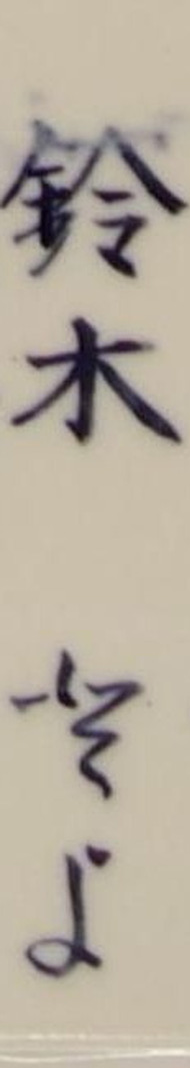鈴木とよ
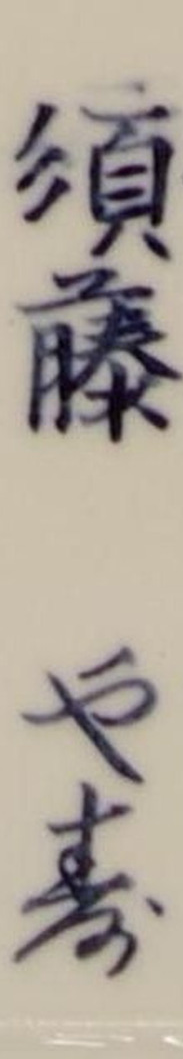須藤やす
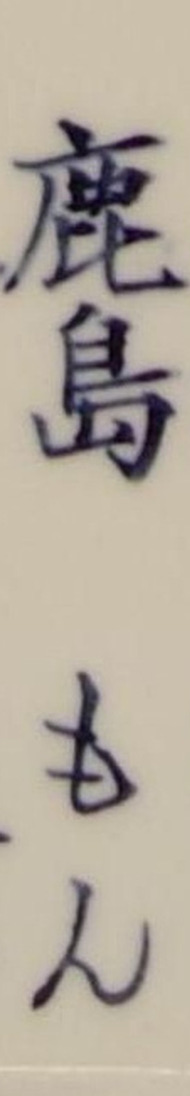鹿島もん
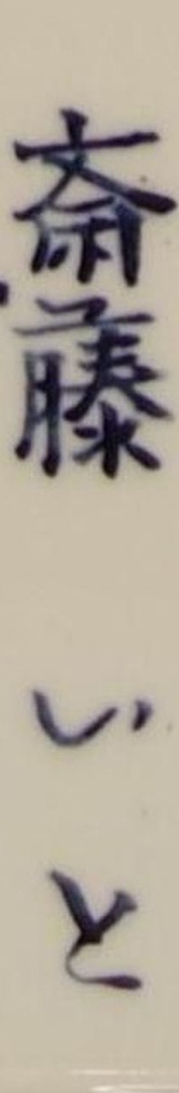斉藤いと
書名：E~L
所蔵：高野山金剛峯寺
